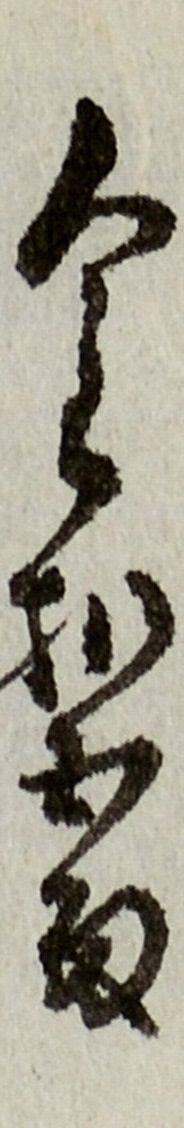金拾五両
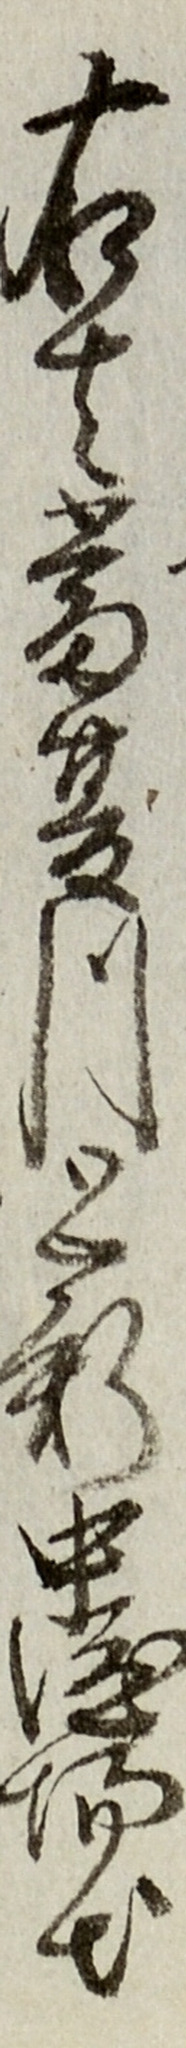右者当夏川御薪中渡場出
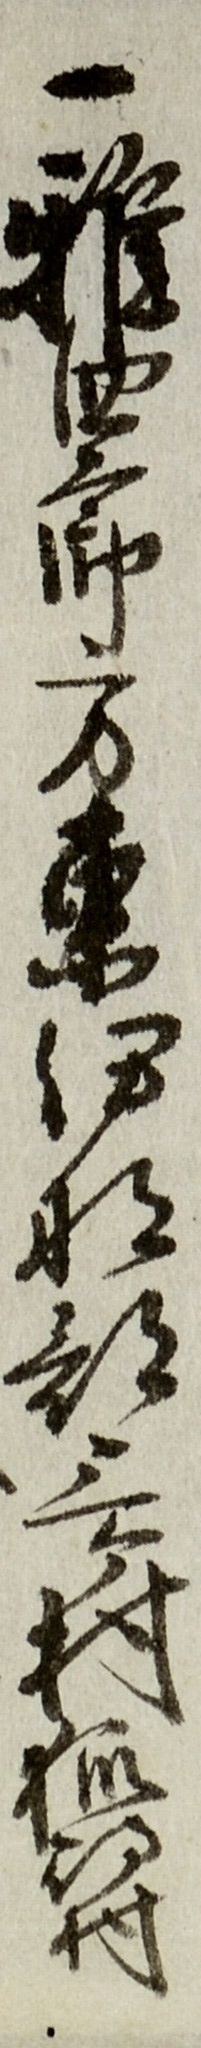一雅四郎方東伊那郡三ケ村狐嶋村
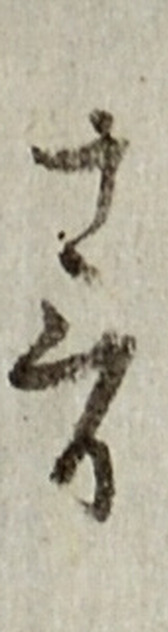十三日
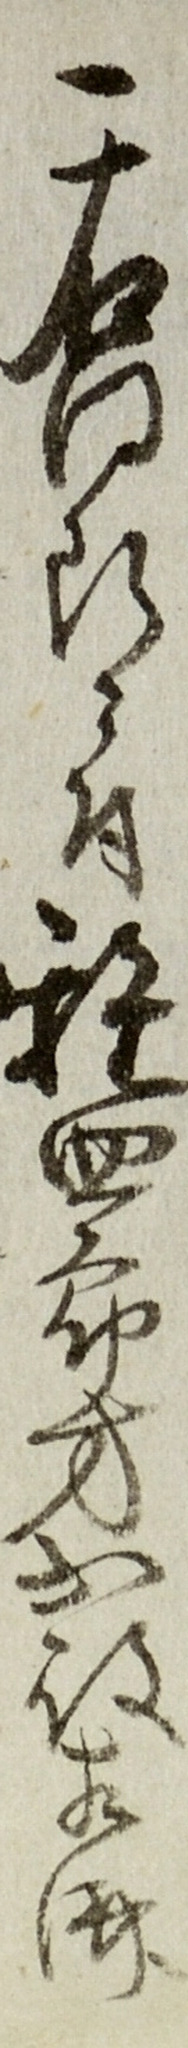一右同断ニ付雅四郎方出役相済
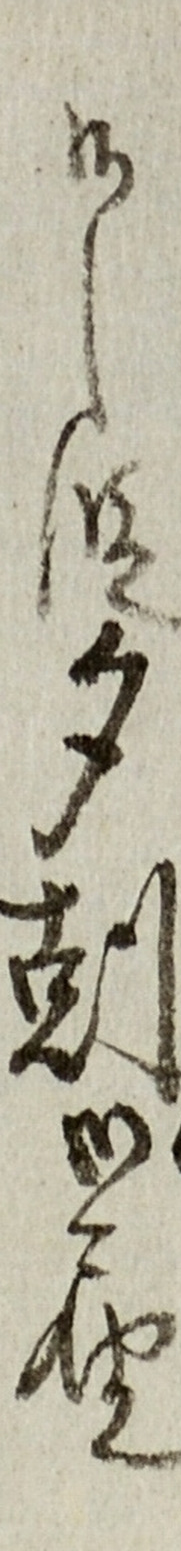候之段夕刻御届
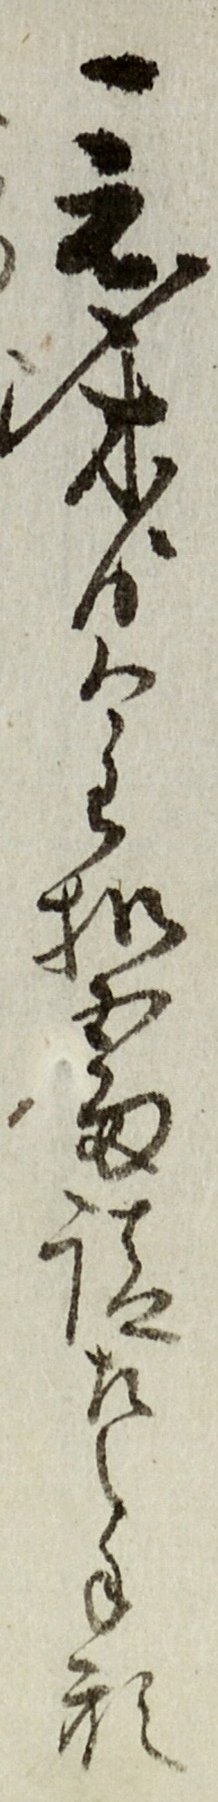一元〆方ゟ金拾五両請取候手形
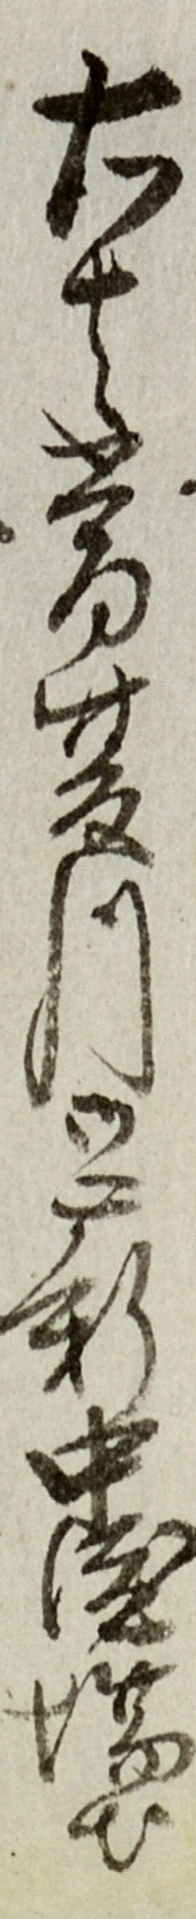右者当夏川御薪中渡場出
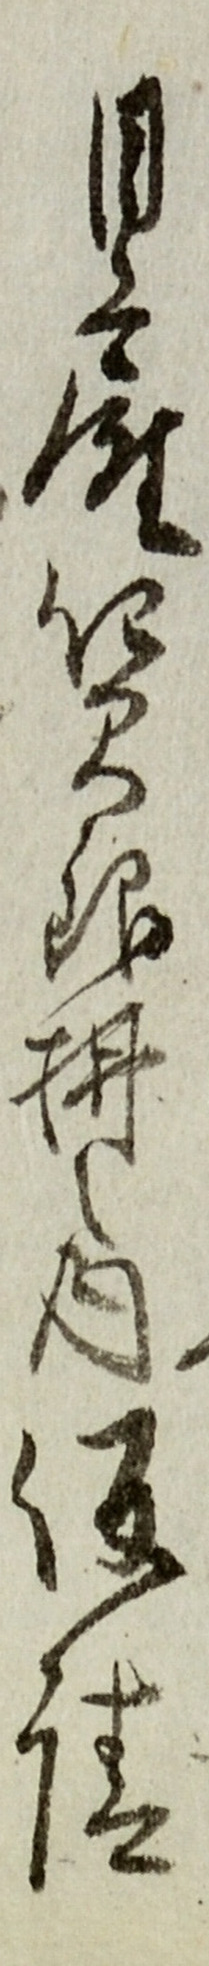日雇賃銀払之内仮請
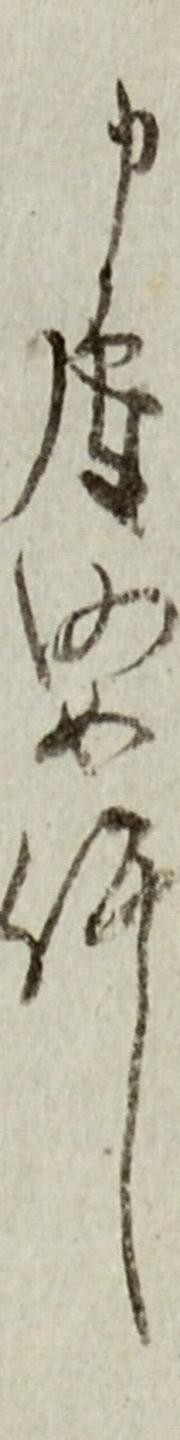申処仍如件
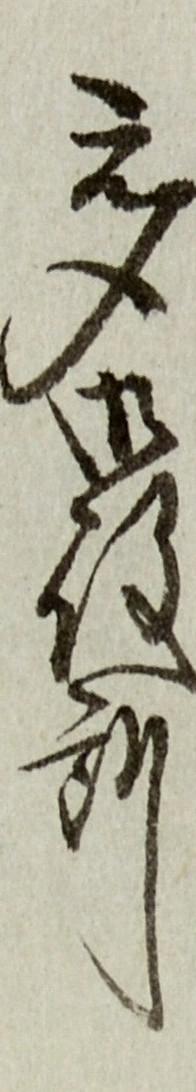元〆御役所
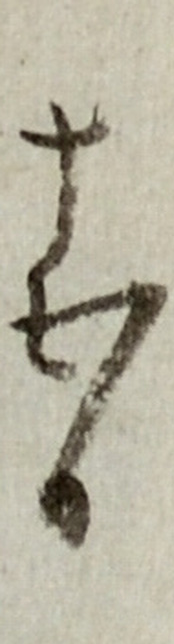十五日
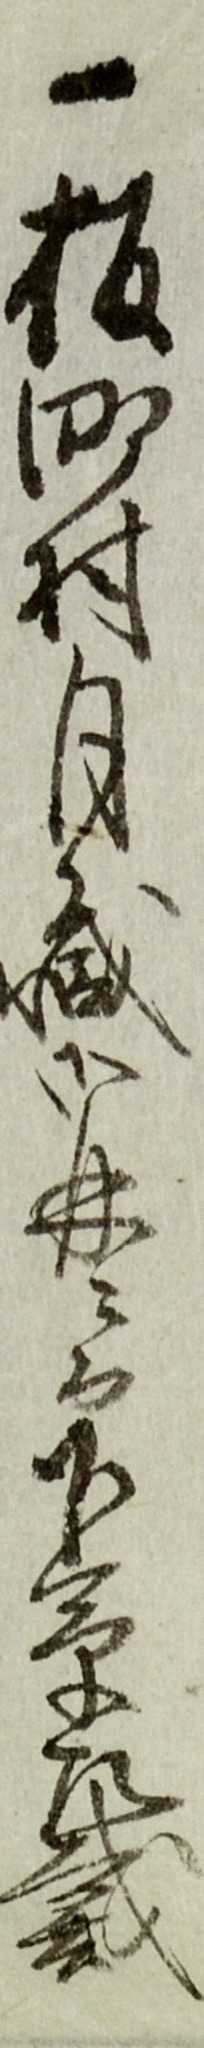一板町村月蔵御林ニ而下草頂戴
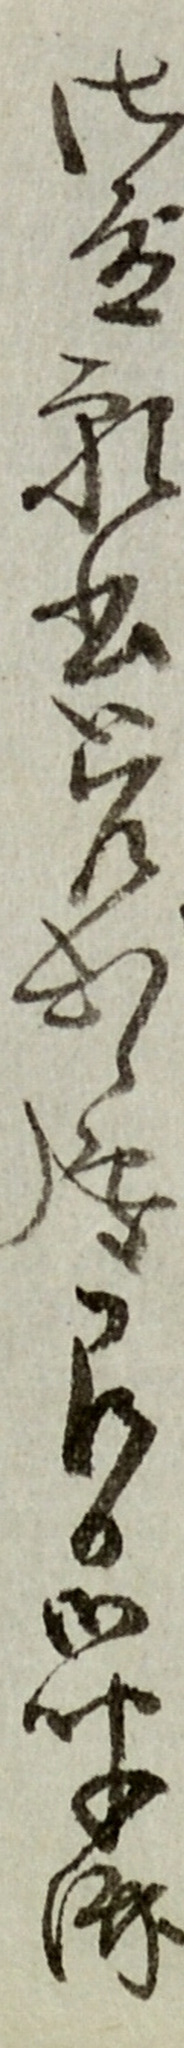仕度願書差出候処即日御聞済

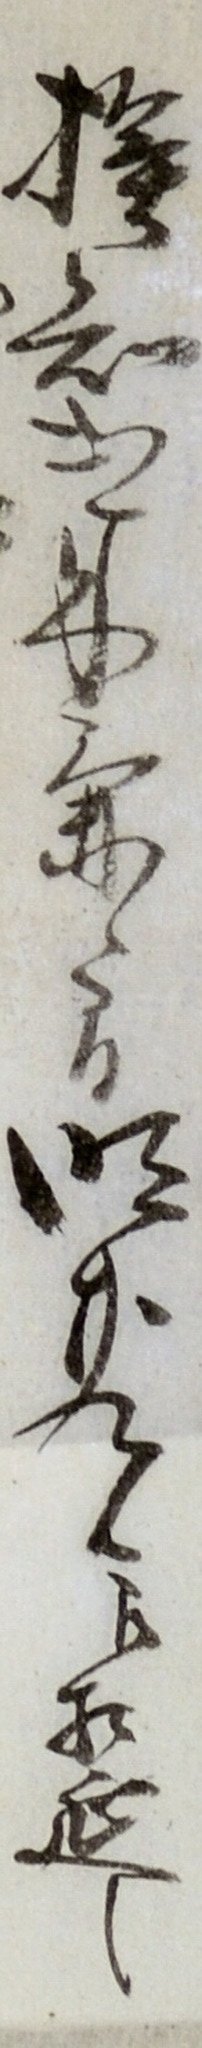検知出来兼候間明廿九日江相延し
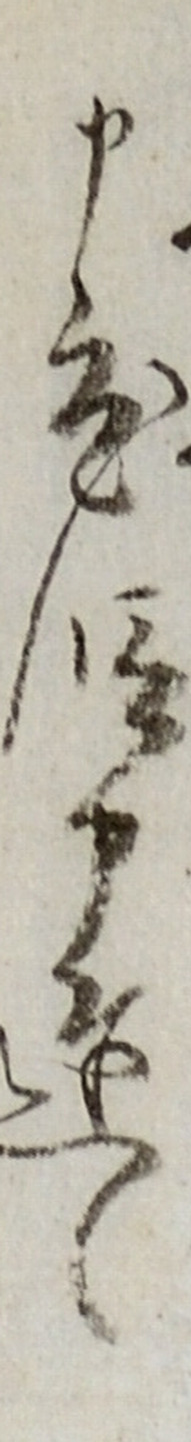申度段申達候
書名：御山方御薪方諸事御用留
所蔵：伊那市立高遠町図書館・合同会社AMANE
